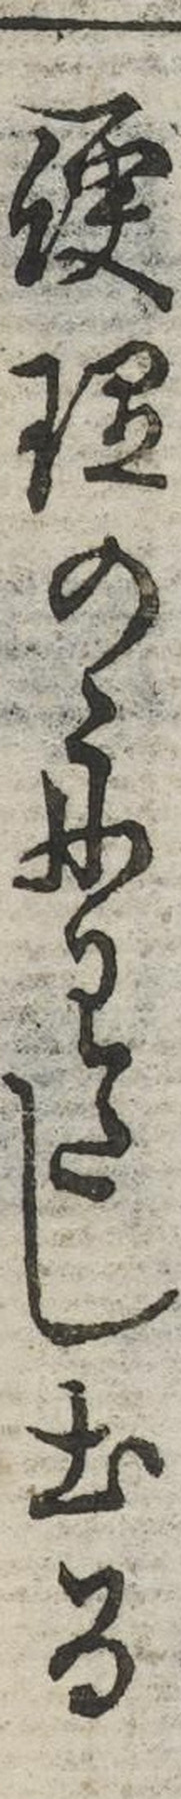便理の舟わたし出る

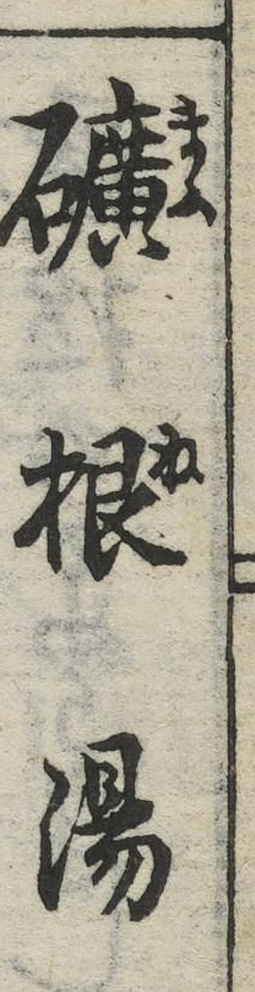礦根湯
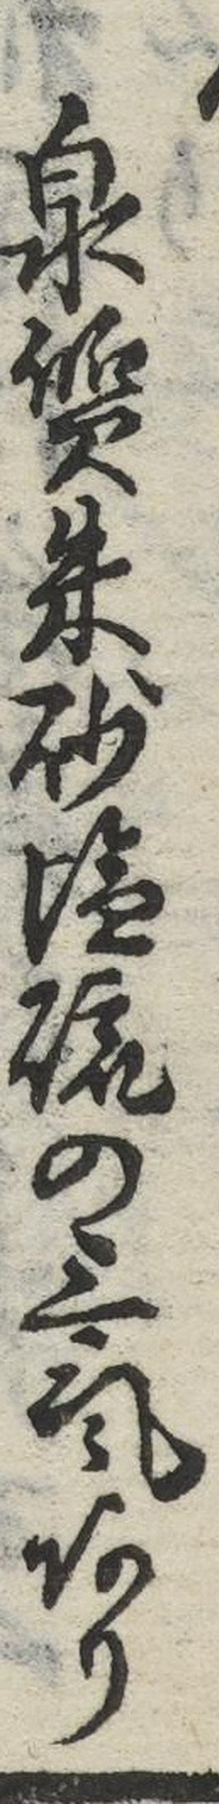泉質朱砂塩硫の三気あり
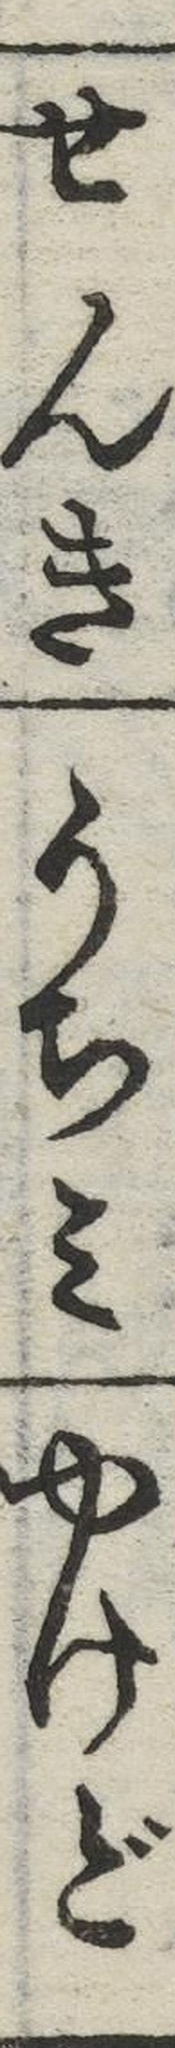せんきうちみやけど
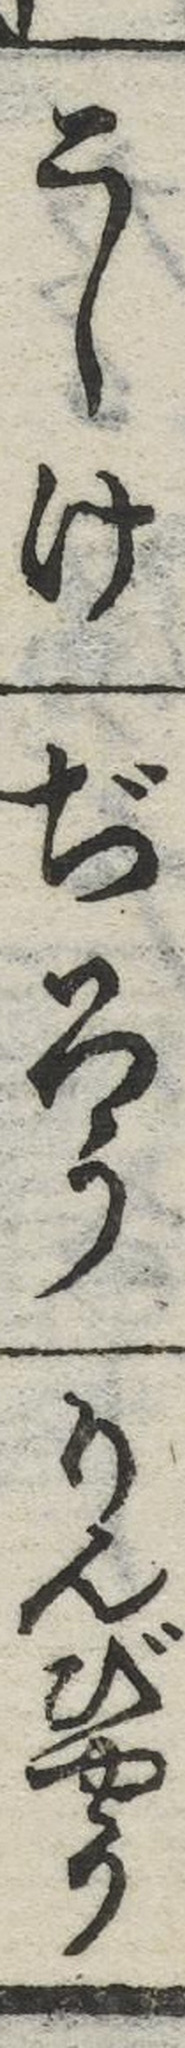こしけぢろうりんびやう
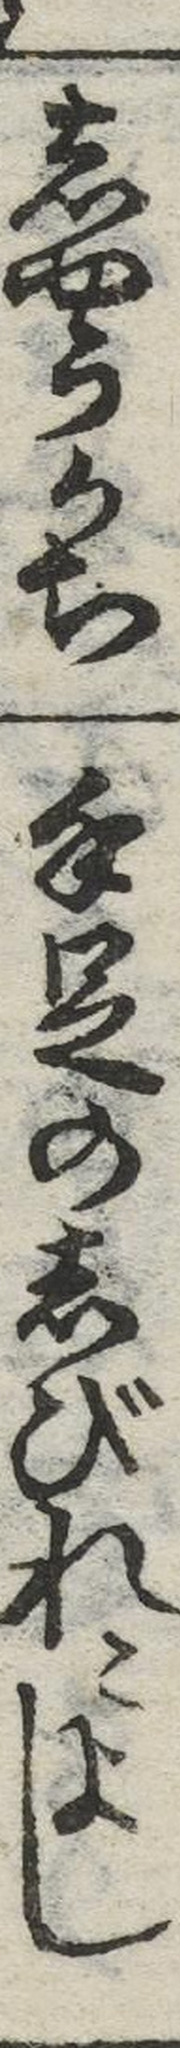しやうかち手足のしびれによし
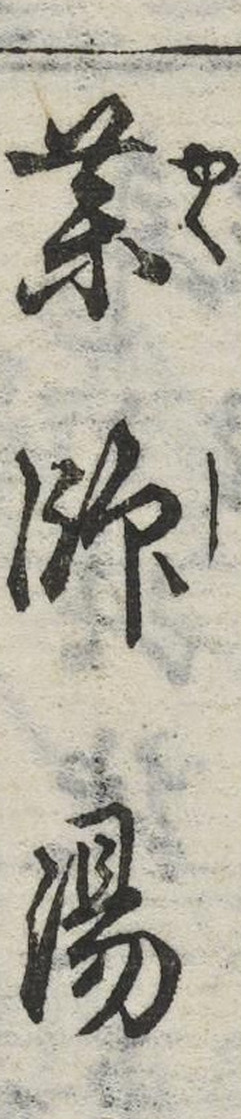薬師湯
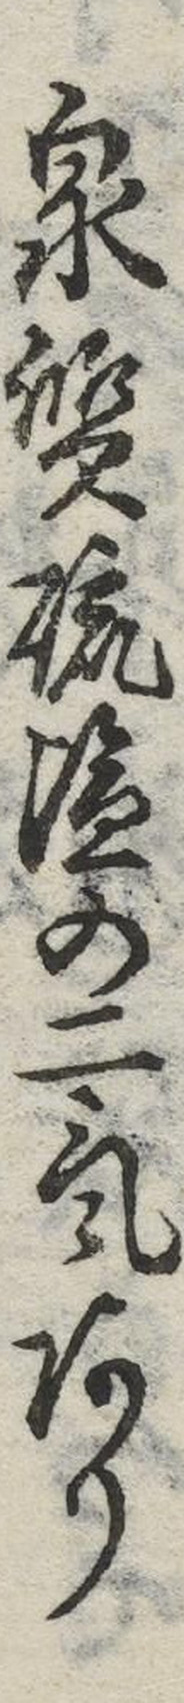泉質硫塩の二気あり
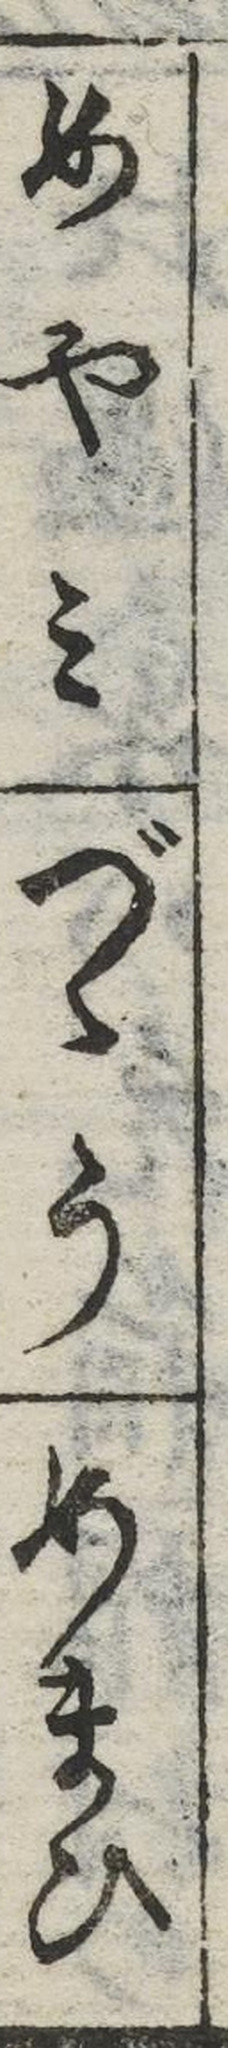めやみづつうめまひ
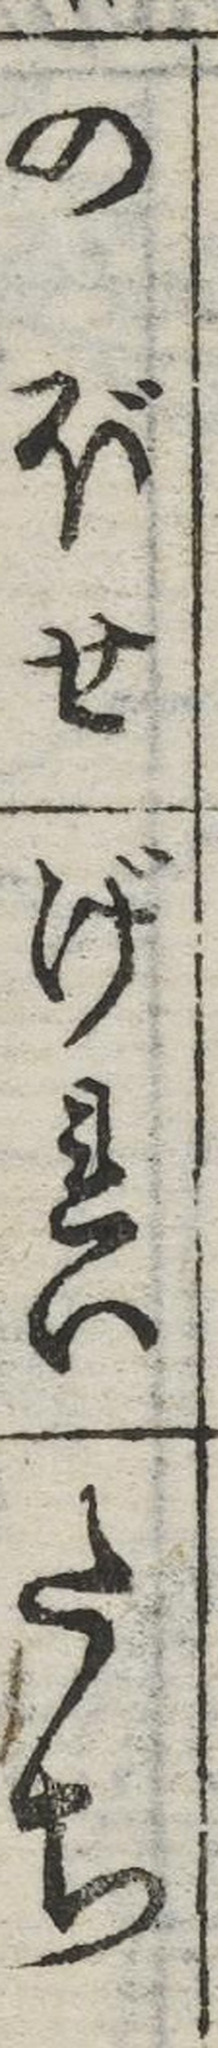のぼせげれいたち
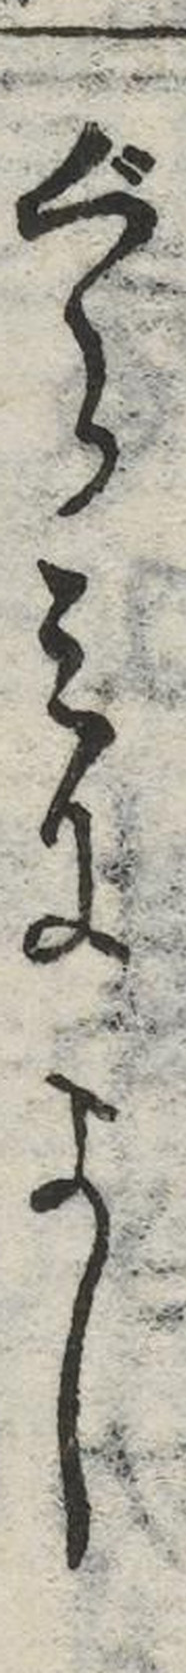ぐらみによし
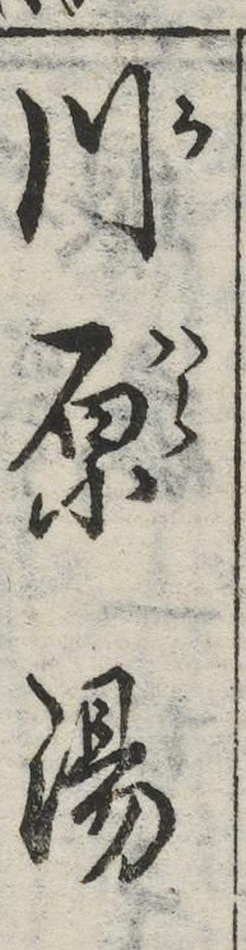川原湯
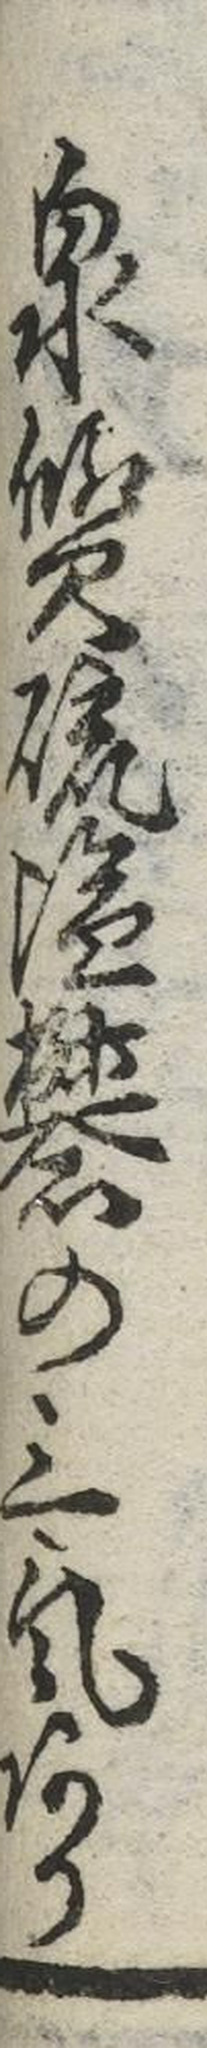泉質硫塩礬の三気あり
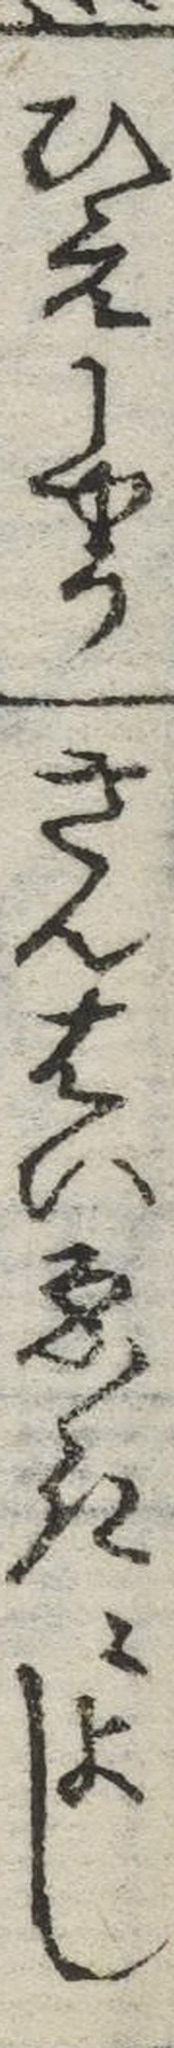ひえしやうさんはいゑきによし
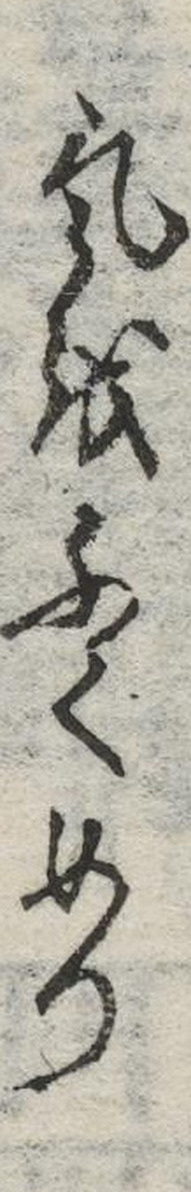気をふくめり
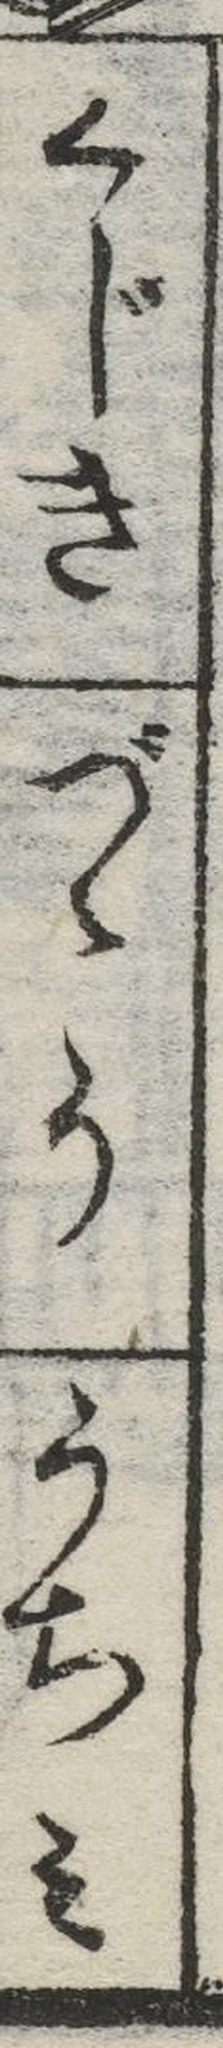くじきづゝううちみ
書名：諸國温泉遊覽記　全
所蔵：東京大学地震研究所図書室 Earthquake Research Institute Library, The University of Tokyo, JAPAN
